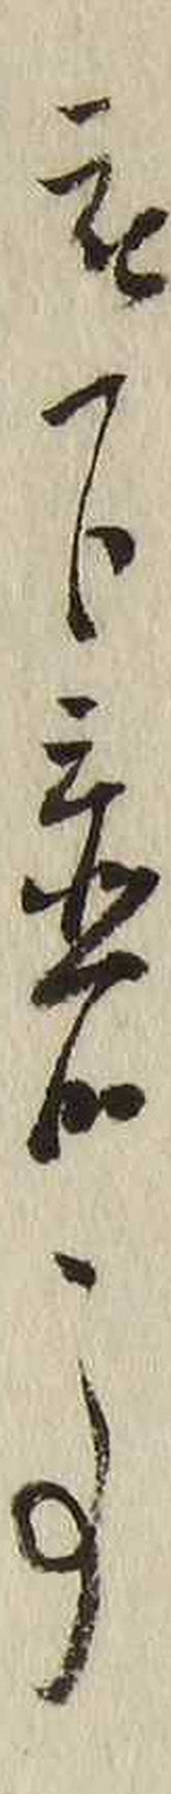被下置候事
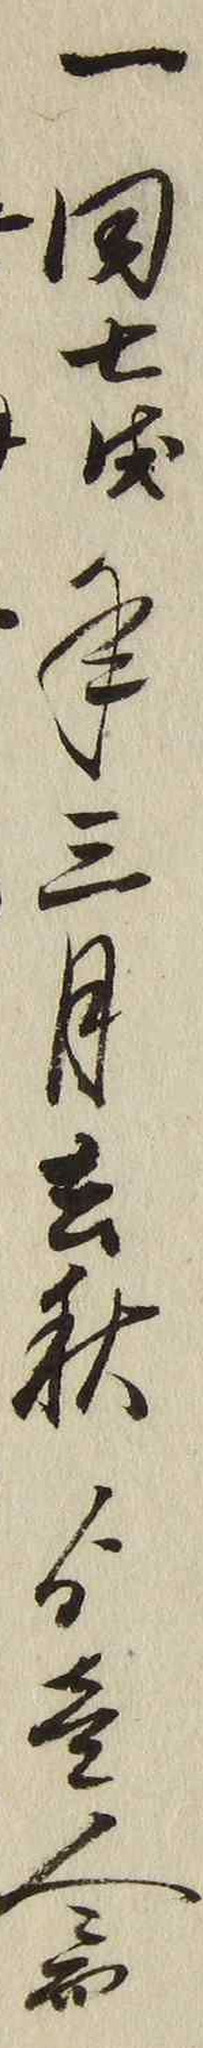一同七戌年三月去秋ゟ壱人ニ而
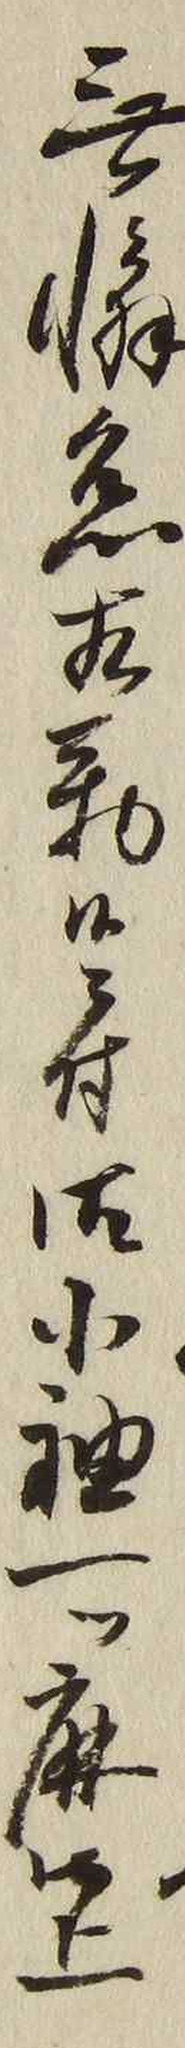無懈怠相勤候ニ付御小袖一ツ麻御上
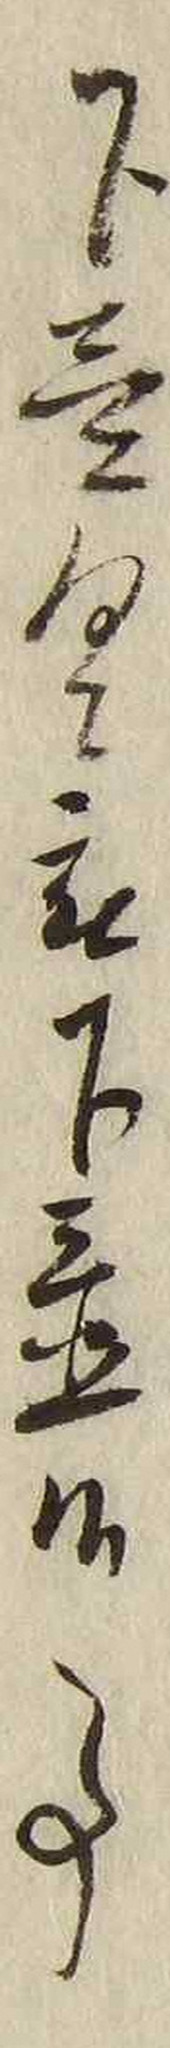下壱具被下置候事

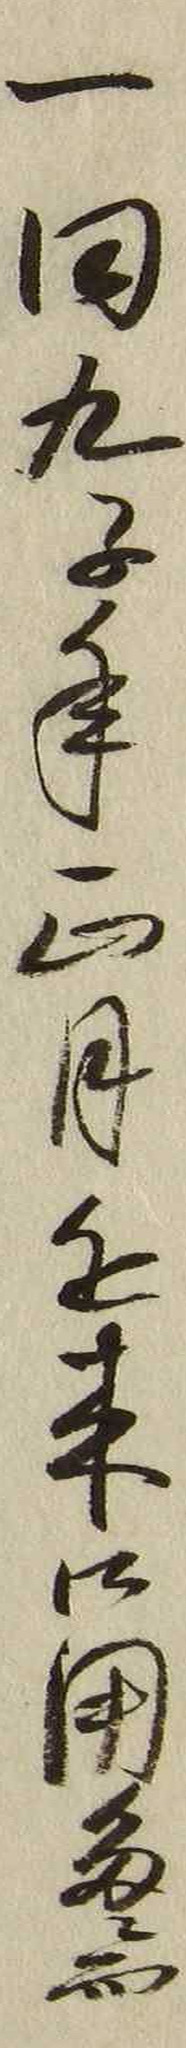一同九子年正月近来御用多ニ而
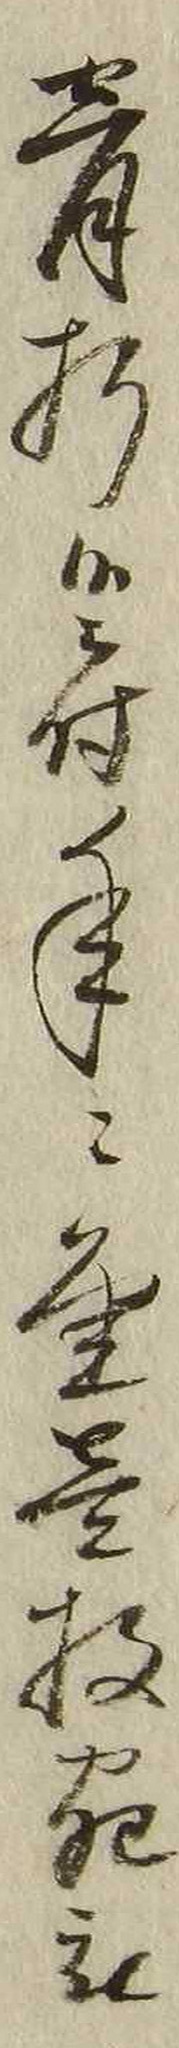骨折候ニ付年ニ金壱枚宛被
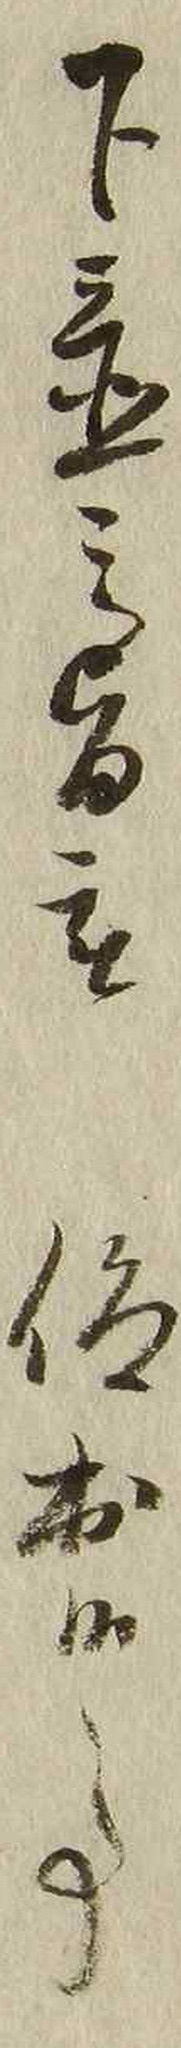下置之旨被仰出候事
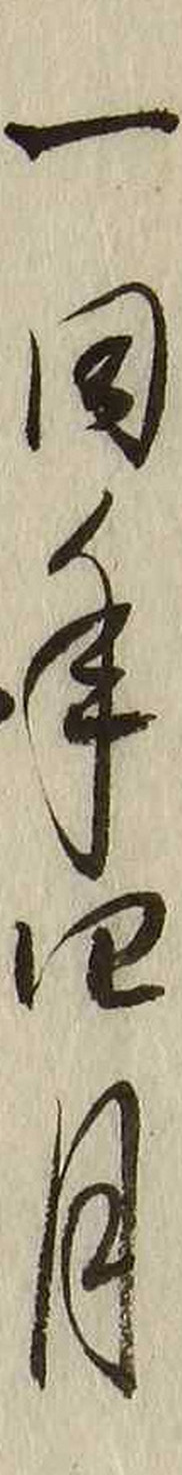一同年四月
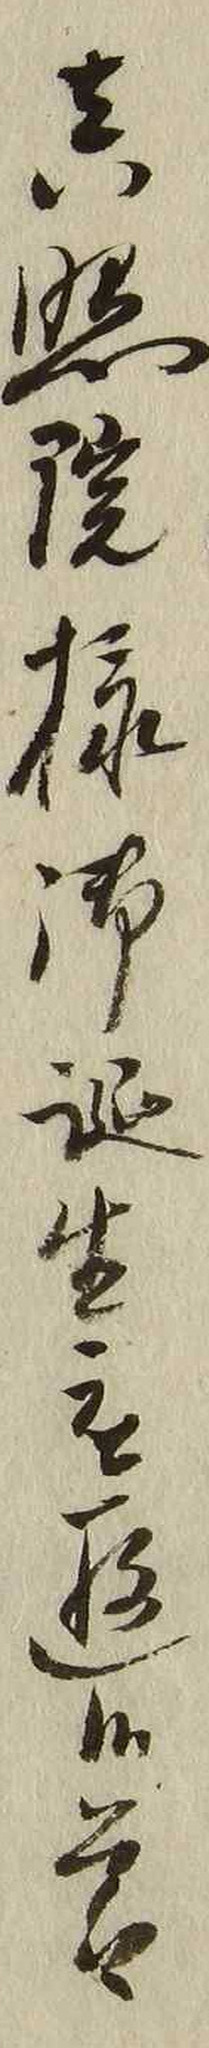真照院様御誕生被遊候節
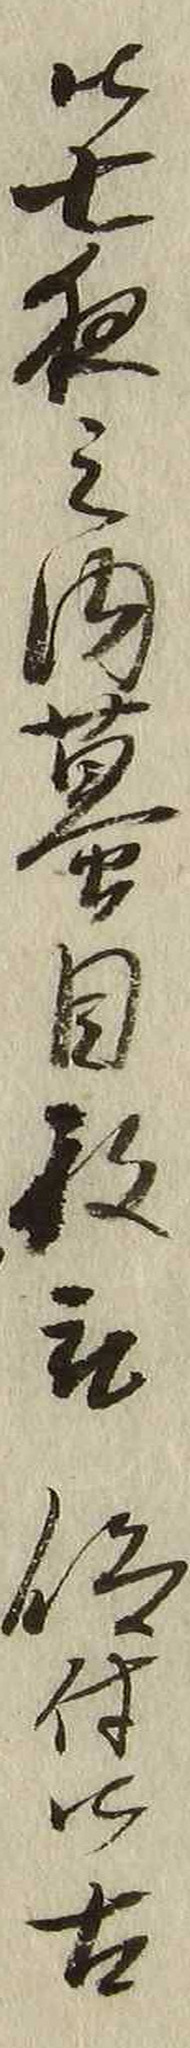御七夜之内蟇目役被仰付御古
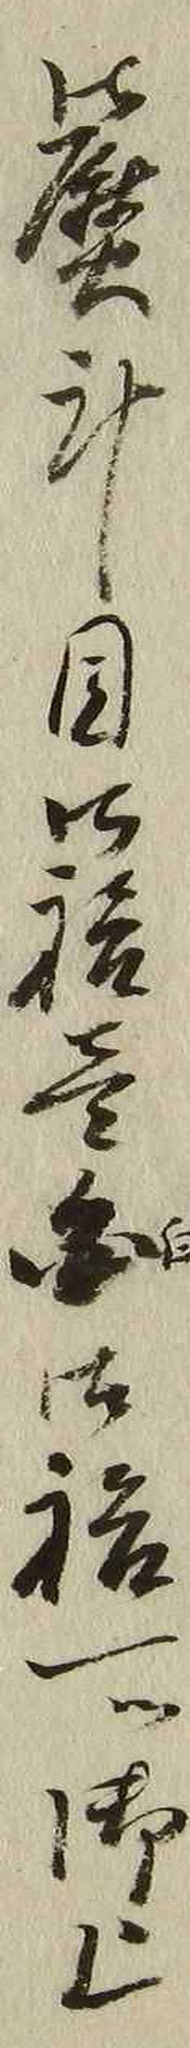御熨斗目御袷壱白御袷一ツ御上
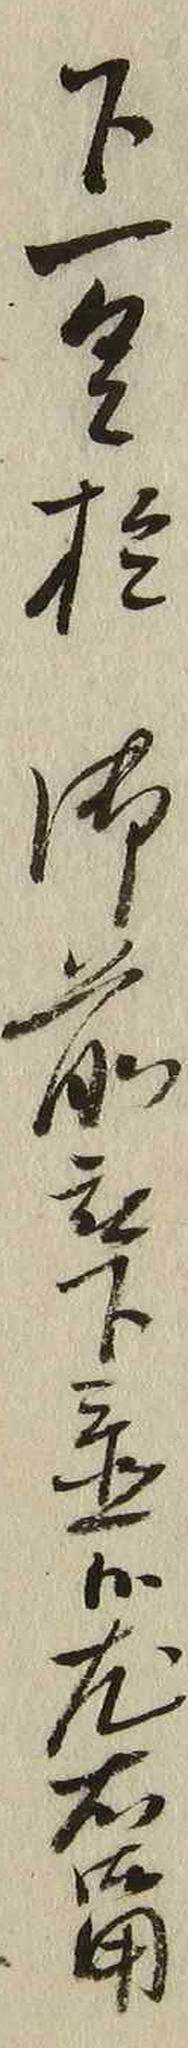下一具於御前被下置候尤右御用
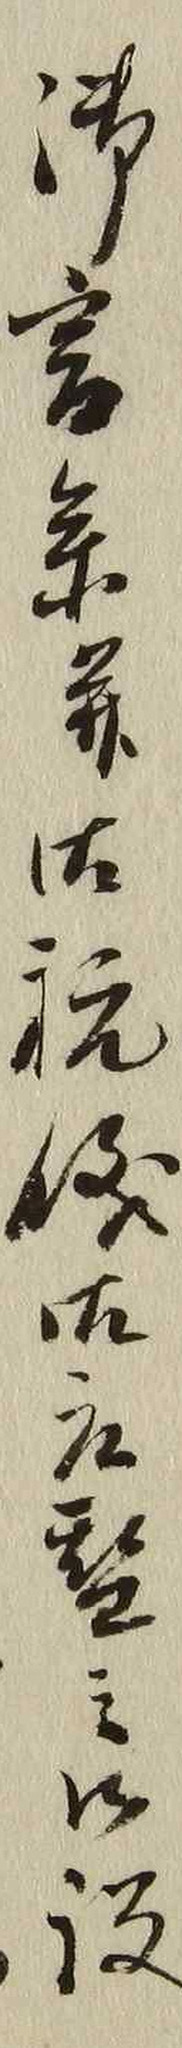御宮参并御祝儀御取替之御役
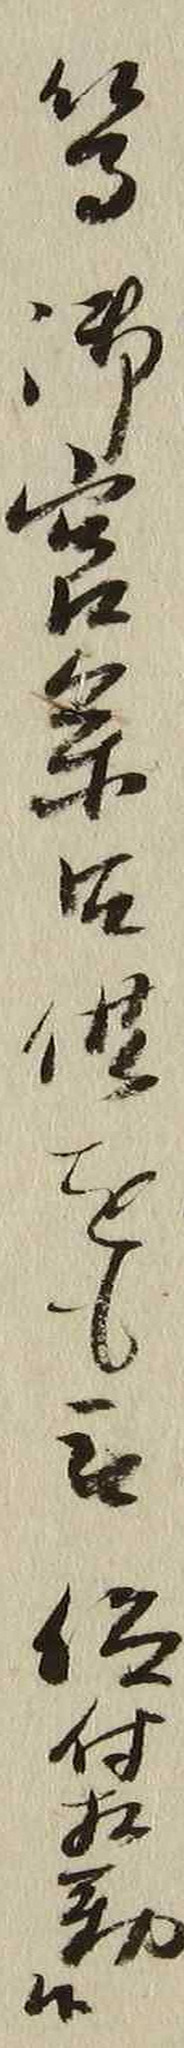等御宮参御供をも被仰付相勤候
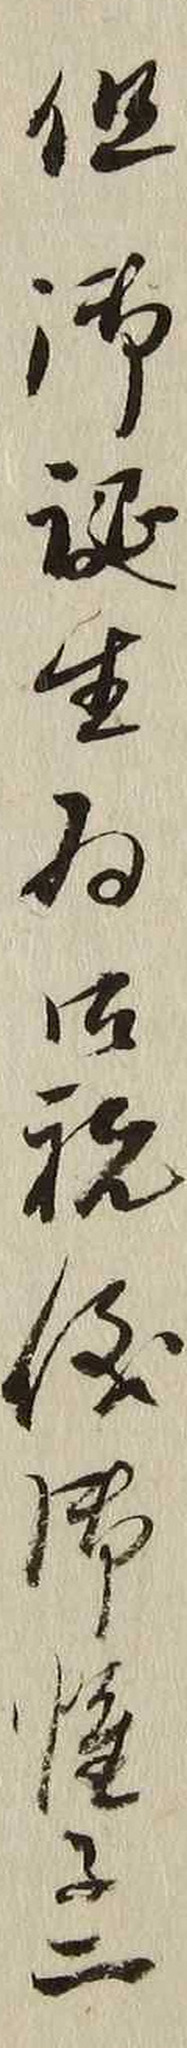但御誕生為御祝儀御帷子二
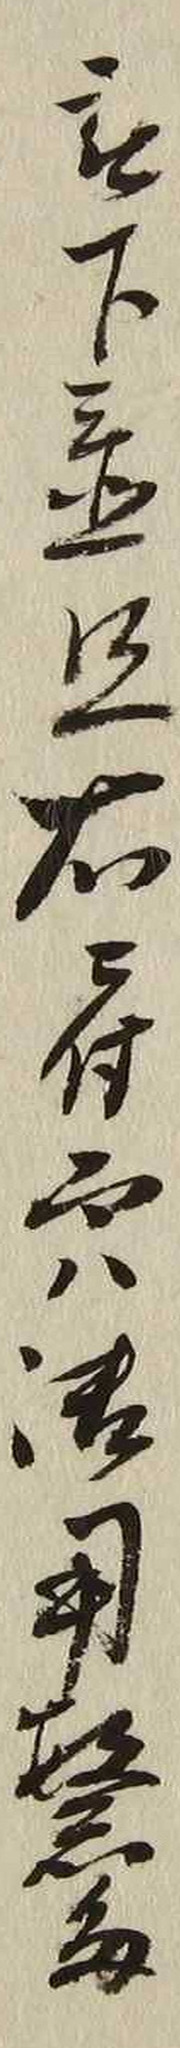被下置且右ニ付而ハ御用繁多
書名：諸士系譜　巻之355　す之部5
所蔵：会津若松市立会津図書館
